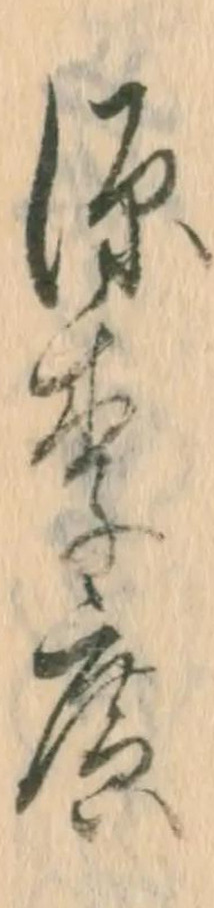源李広
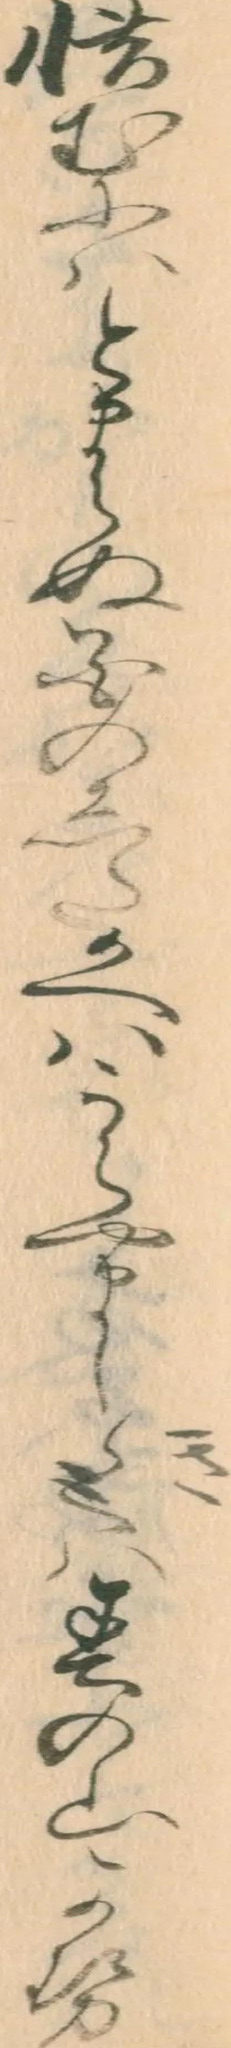惜むにはとまらぬの花したかへはうらやましくは春の山かせ
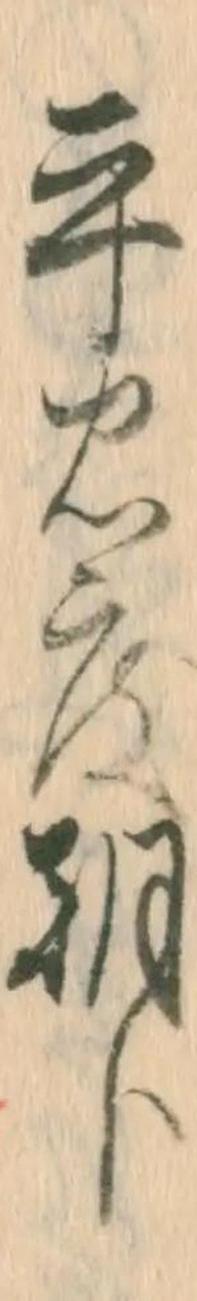平忠度朝臣
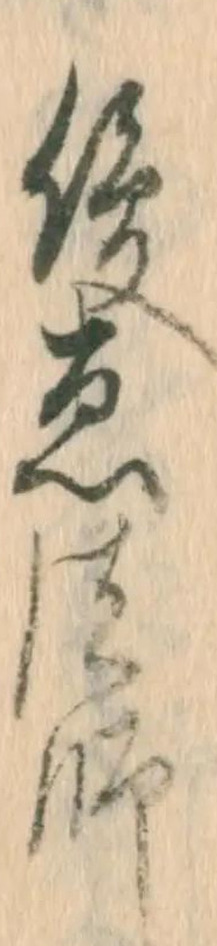俊恵法師
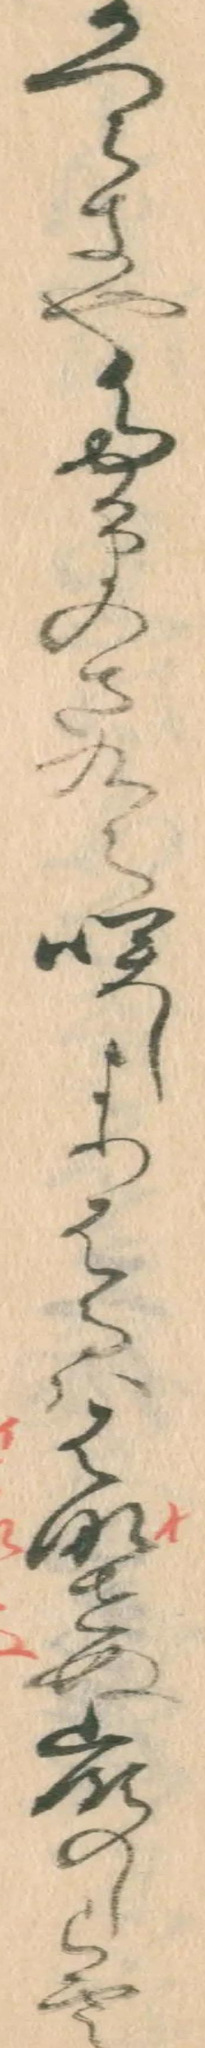かつらきやたかまのさくら咲しよりはるははなせぬ嶺のしら雲
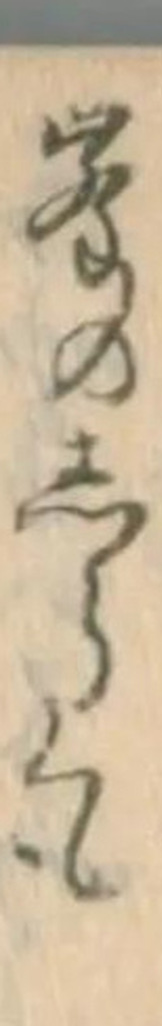峯のしらくも
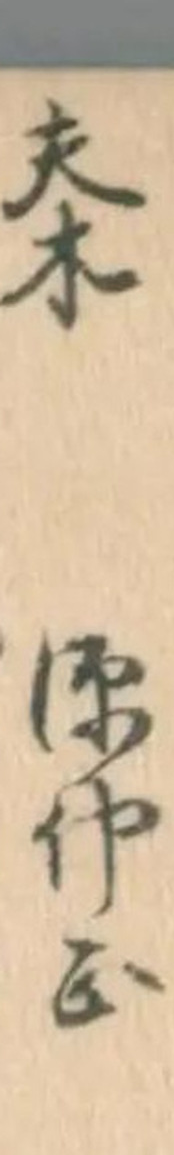夫木源仲正
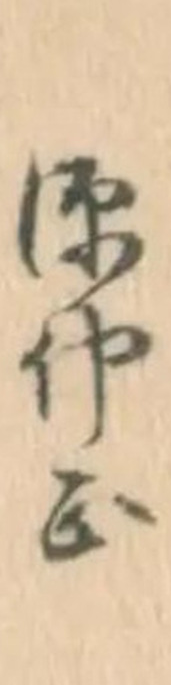源仲正
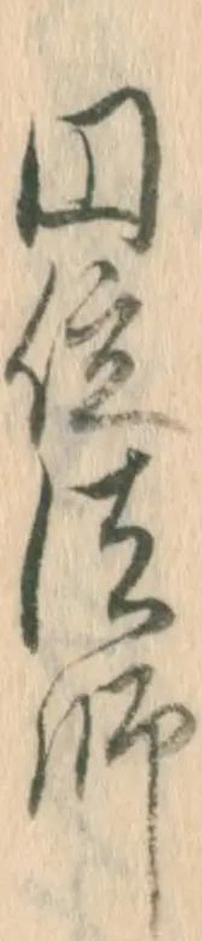円位法師
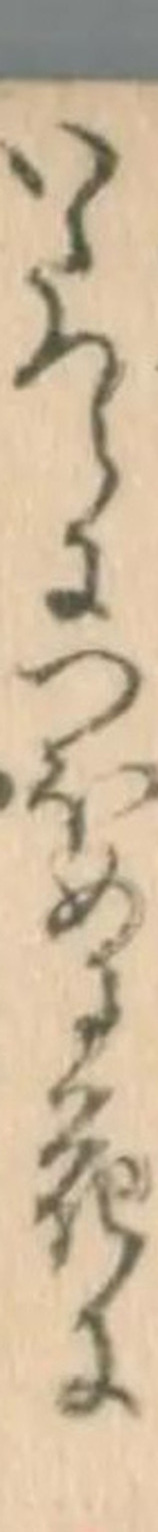いたつらにつほめる花に
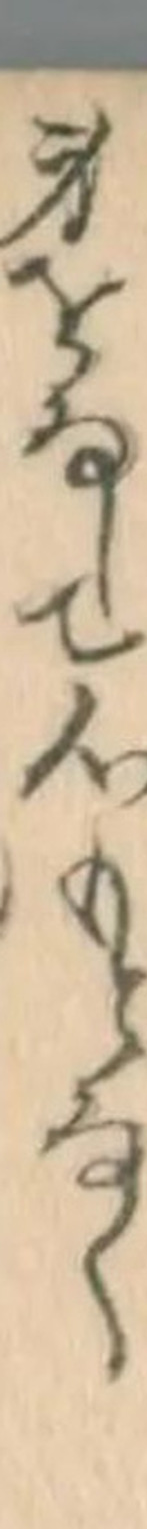身をなして心もとなく
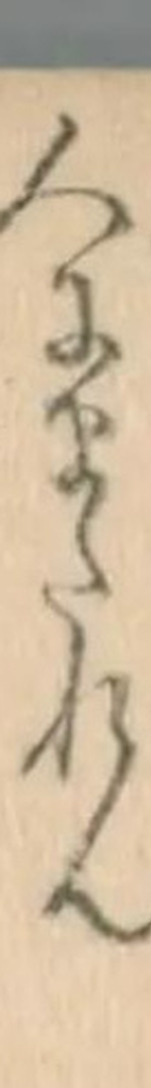人にまたれん
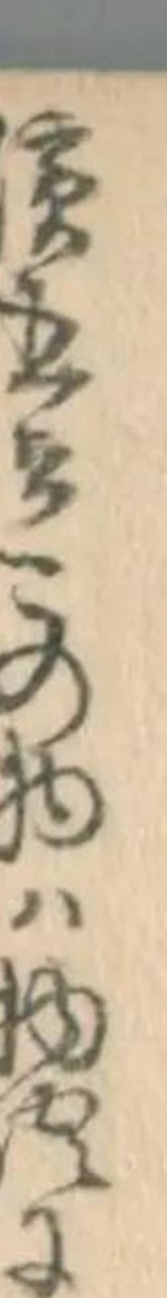浜臣云この物は物語に
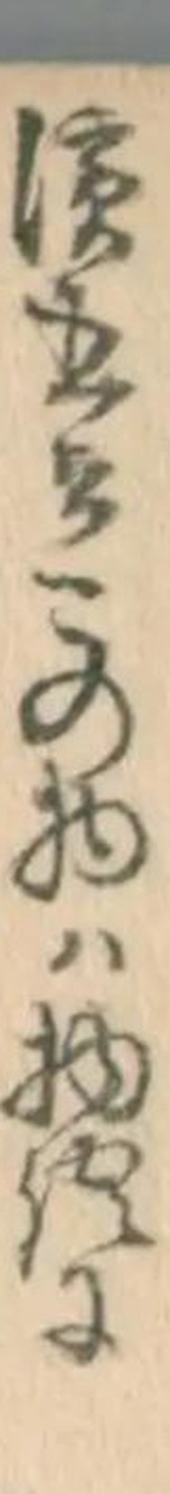浜臣云この物は物語に
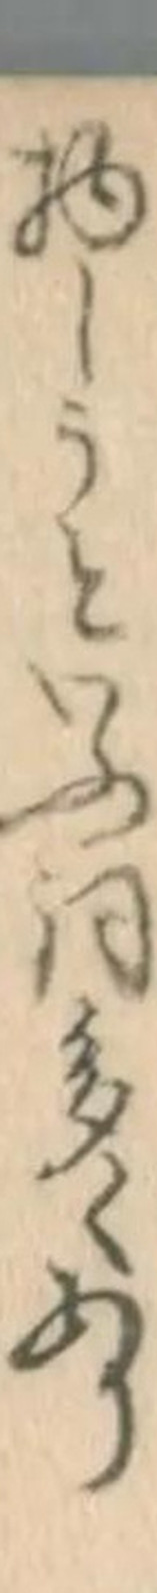物しうといふ詞多くあり
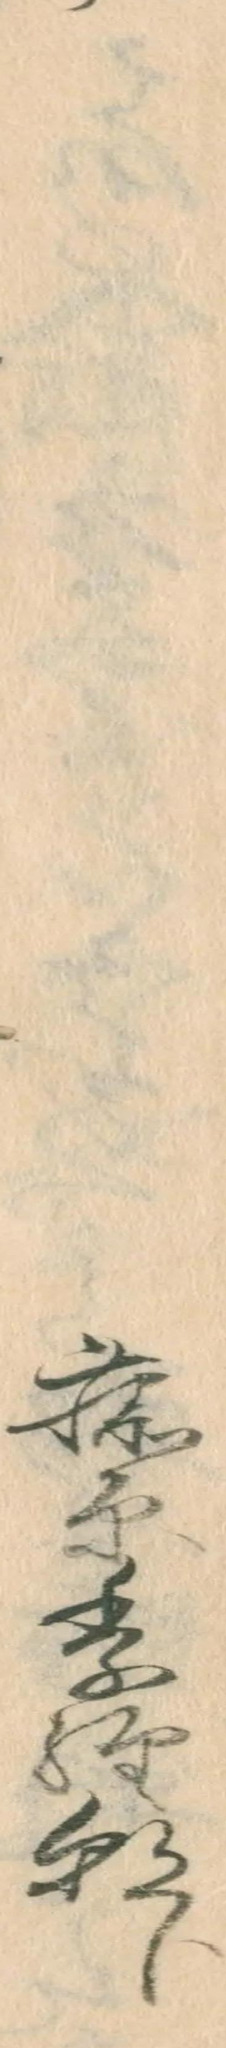藤原李経朝臣
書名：月詣和歌集
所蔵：国立国会図書館 National Diet Library, JAPAN
